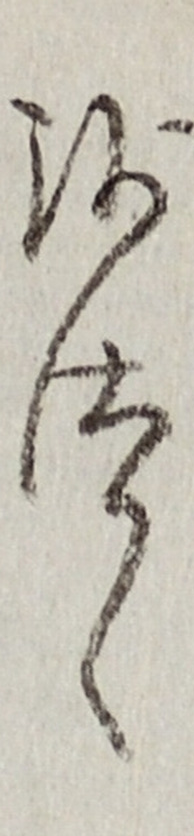沙汰候
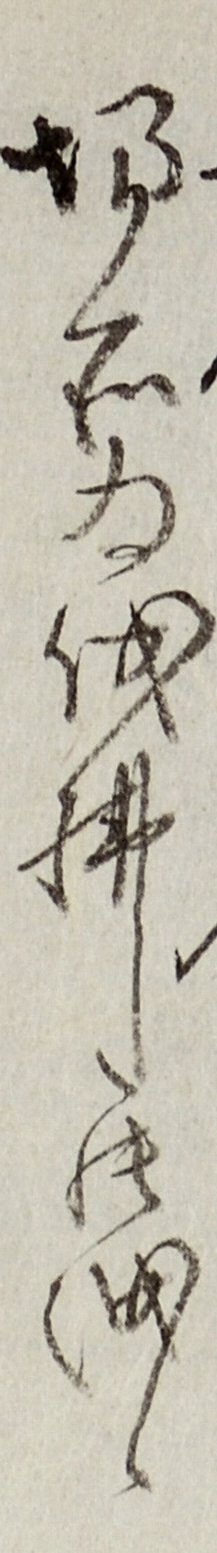場所為伐払罷越候
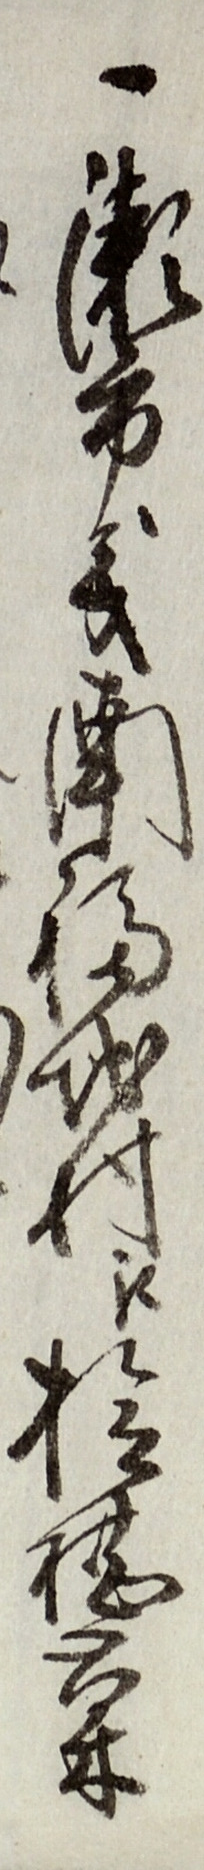一瀬市義南福地村江桧椹苗木
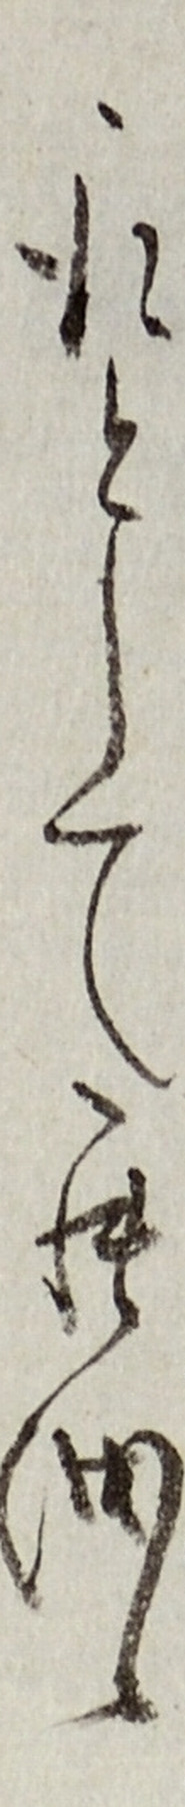取として罷越候
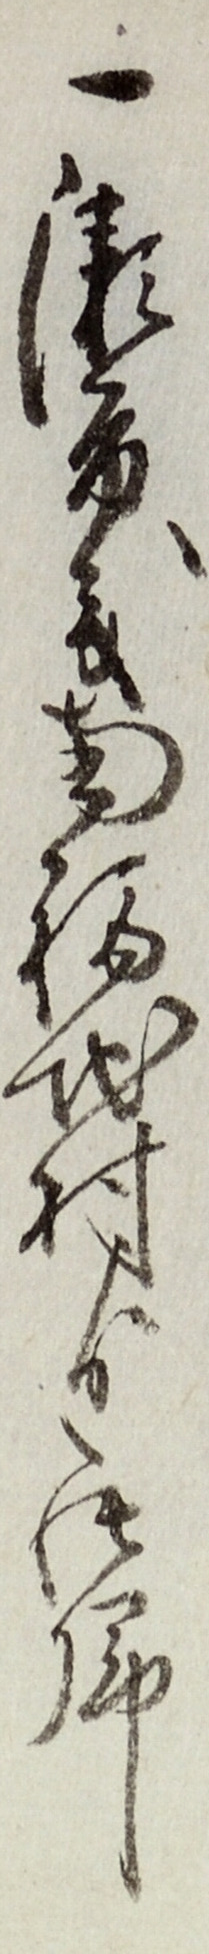一瀬市義南福地村ゟ罷帰
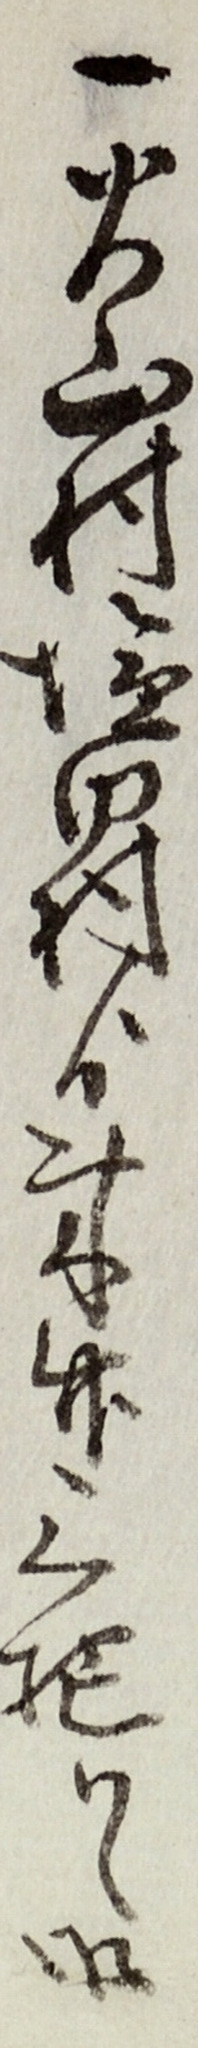一火山村塩田村ゟ束竹三把ツヽ御
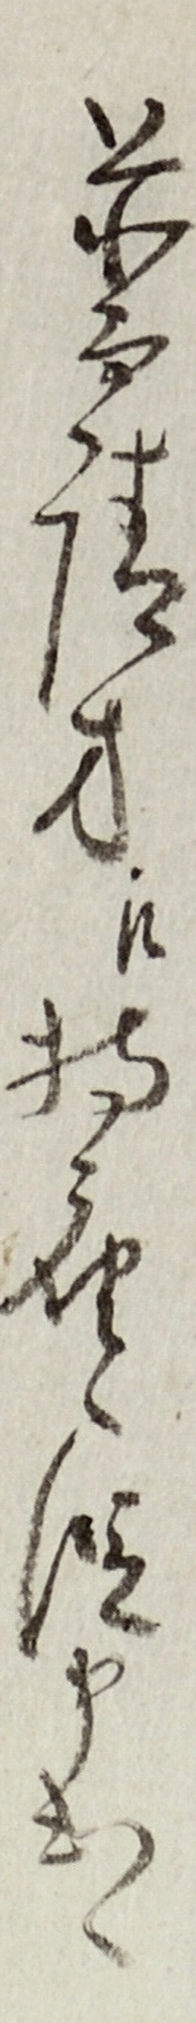普請方江持届候段申出候
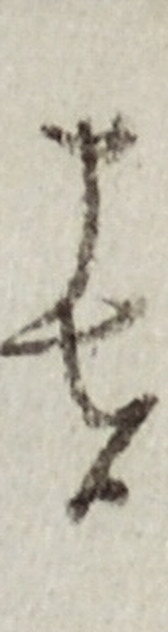十七日
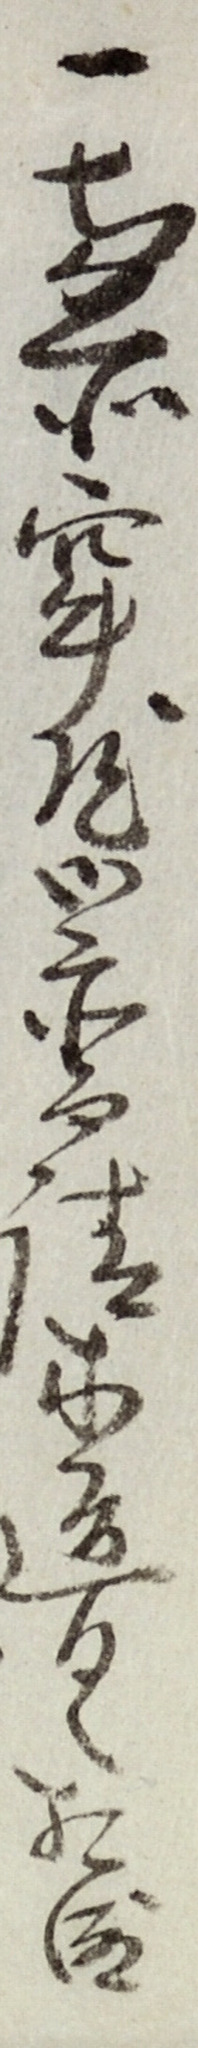一両所牢屋御普請木道具相渡
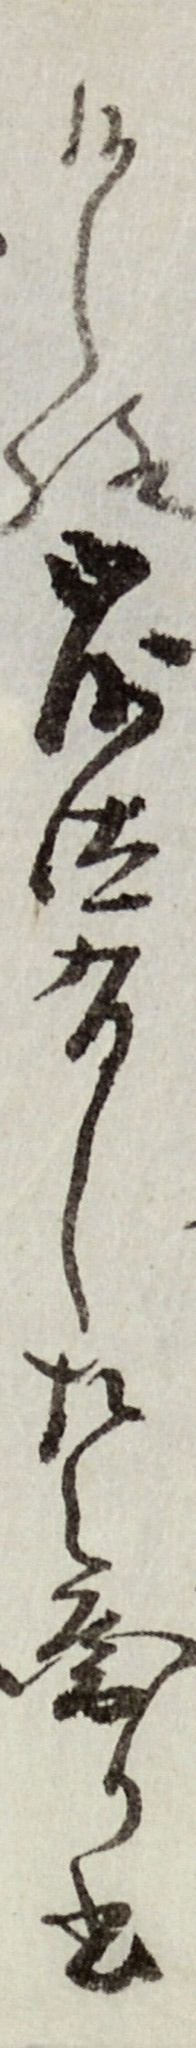候様御沙汰有之候左之図り書
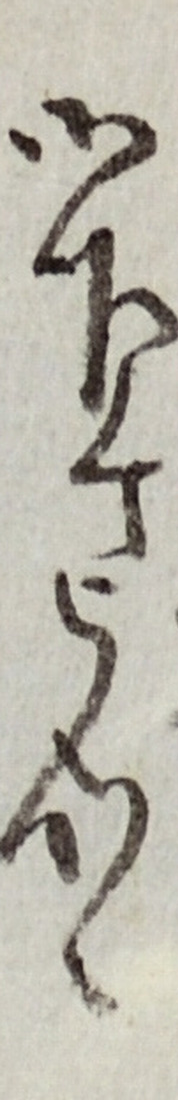御下ケ被成候
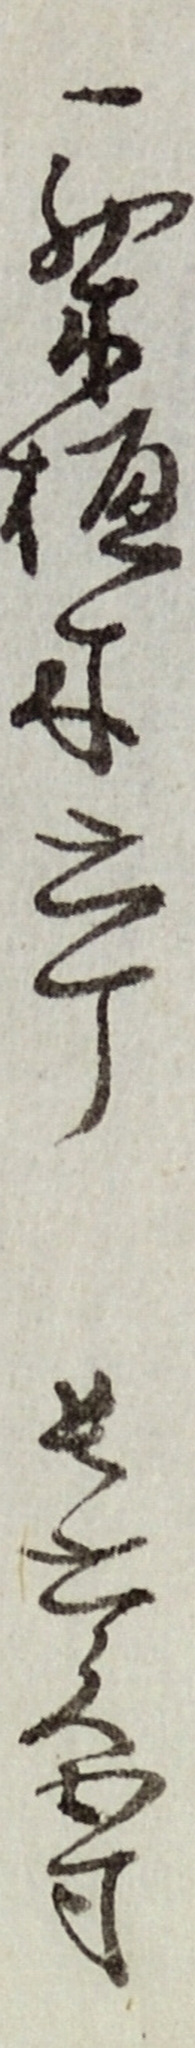一栗樋木六丁長六尺五寸
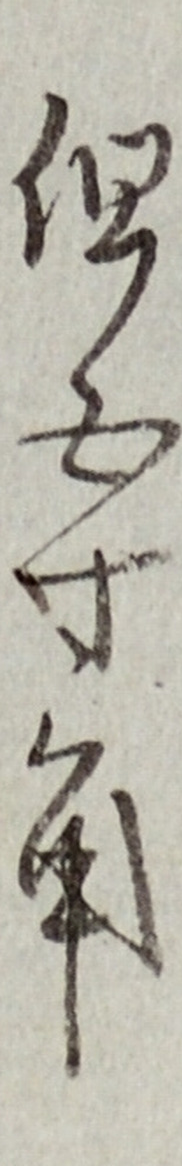但五寸角

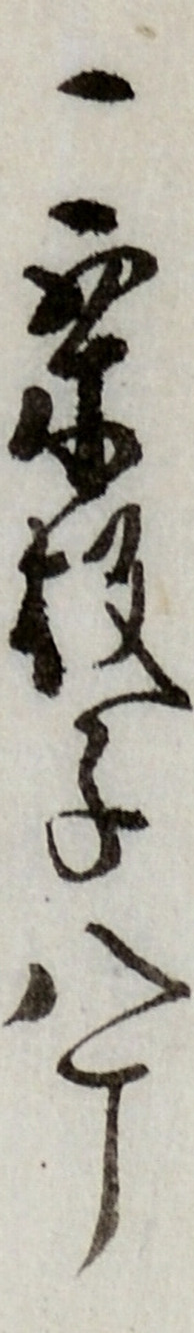一栗板子八丁
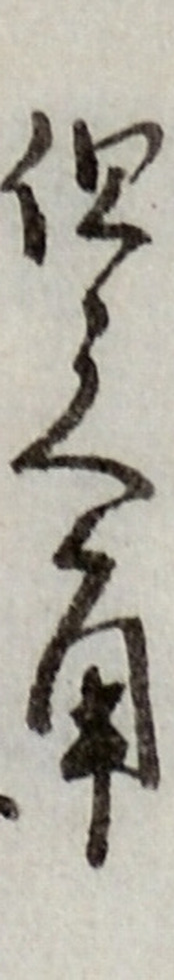但尺角
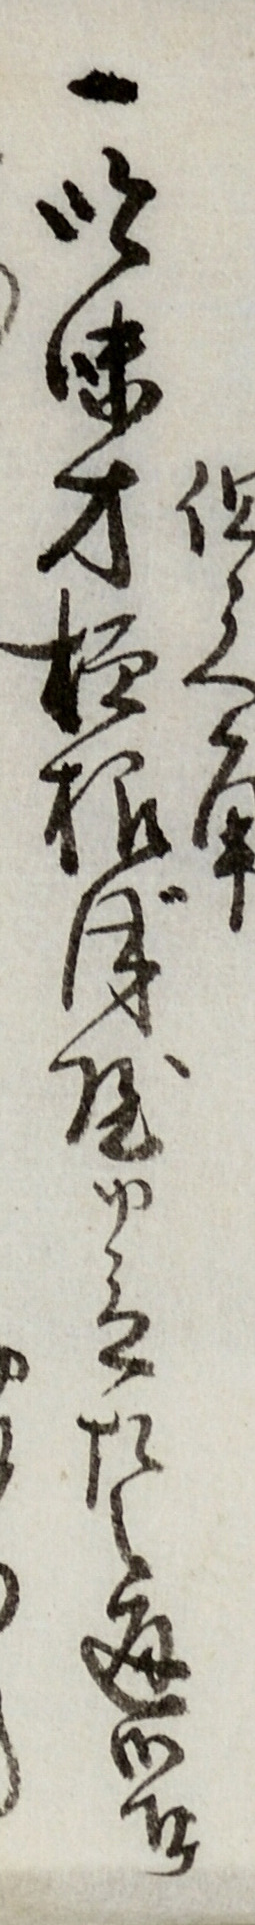一吟味方垣根申立左之通御下ケ
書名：御山方御薪方諸事御用留
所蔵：伊那市立高遠町図書館・合同会社AMANE
